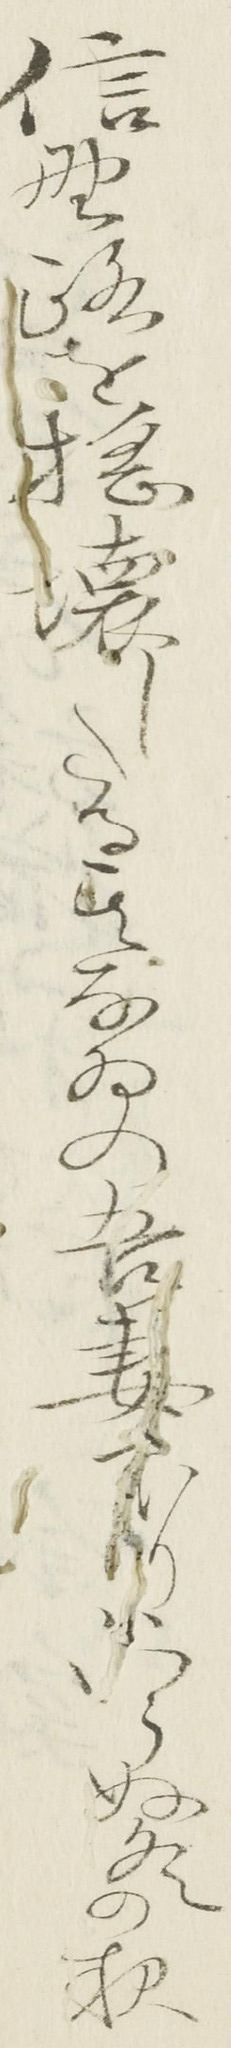信の路を揺壊したる其なゐの吾妻川ハいらぬ冬の夜
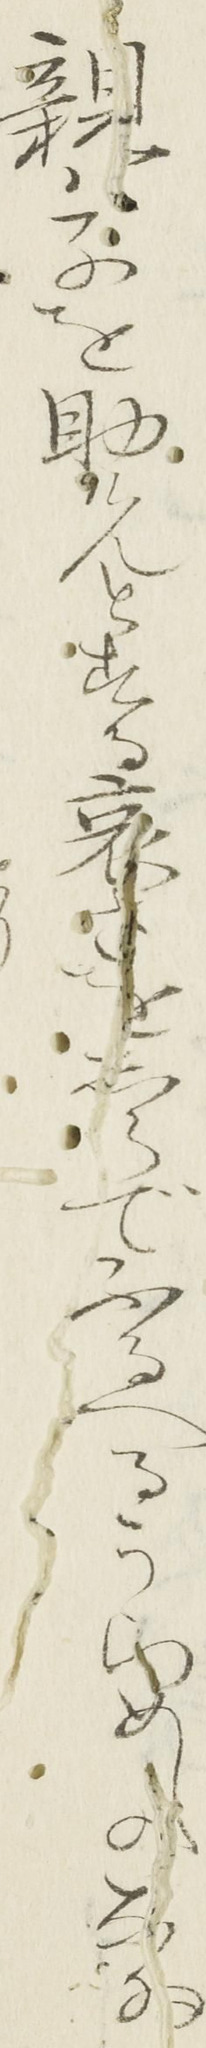親子を助けんとする哀さをしらでふるへるうらねしのなゐ
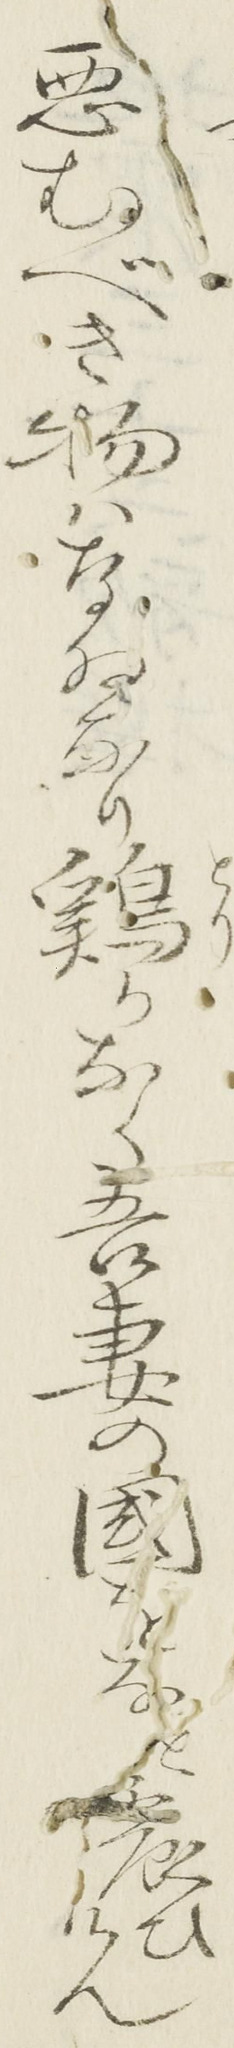悪むべき物ハなゐなり鶏とりかなく吾妻の国をなと震ひけん
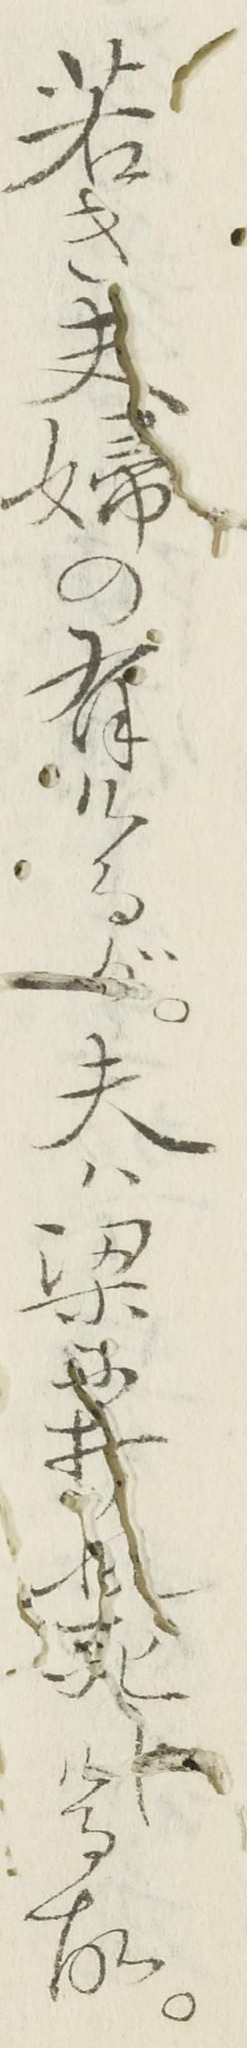若き夫婦の有けるが夫ハ梁に打掛死したる故
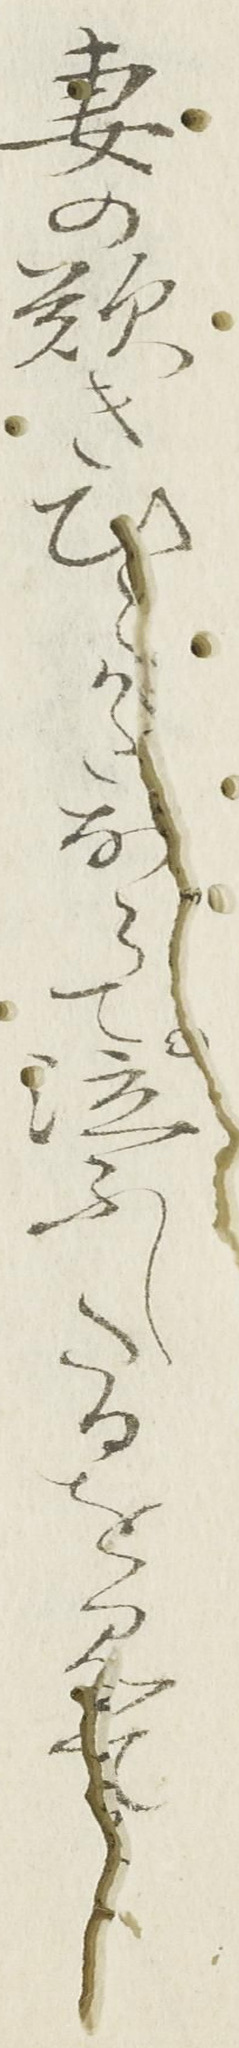妻の歎きひとかたならて泣ふしたるを見て
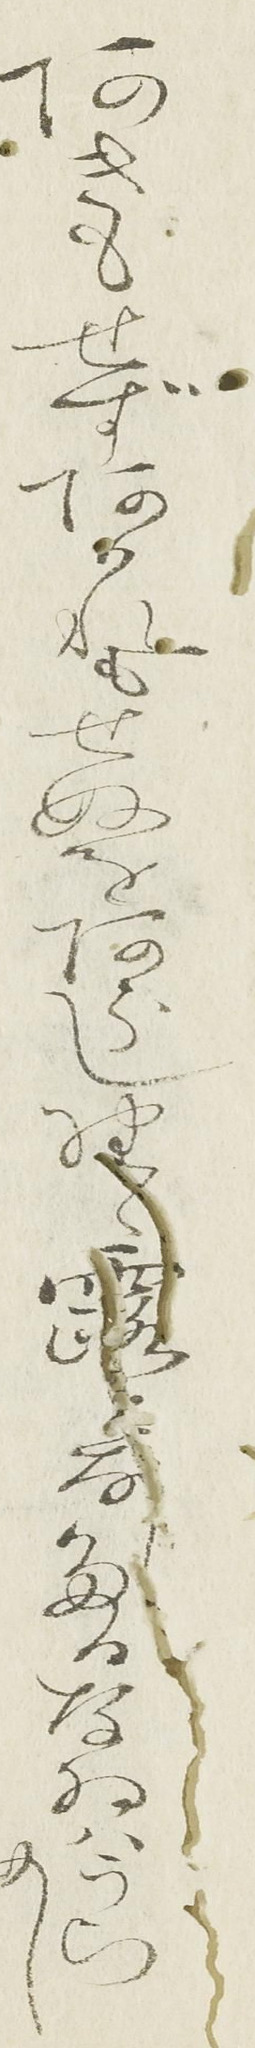あきもせずあハれもせぬをあらしのゝ露になりたるなゐハうらめし
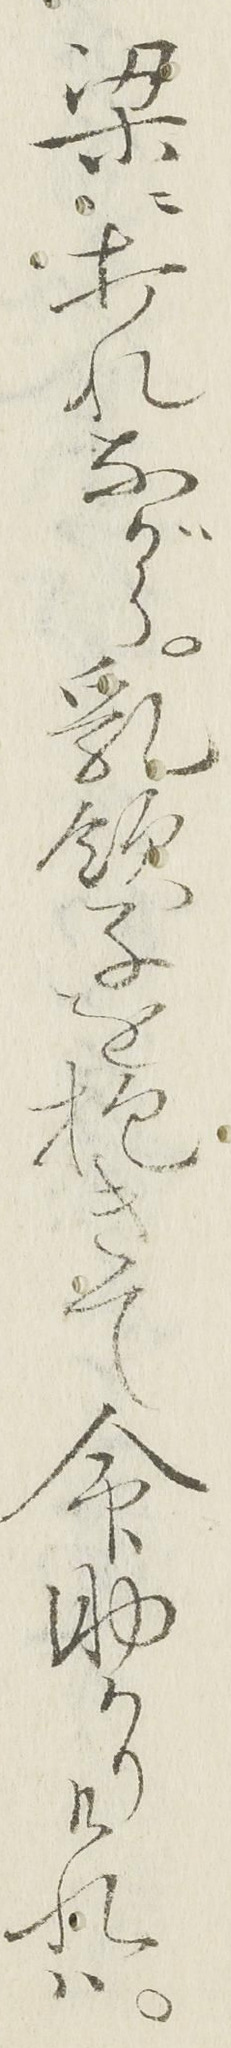梁ニ打れながら乳飲子を抱きて命助かりけれハ
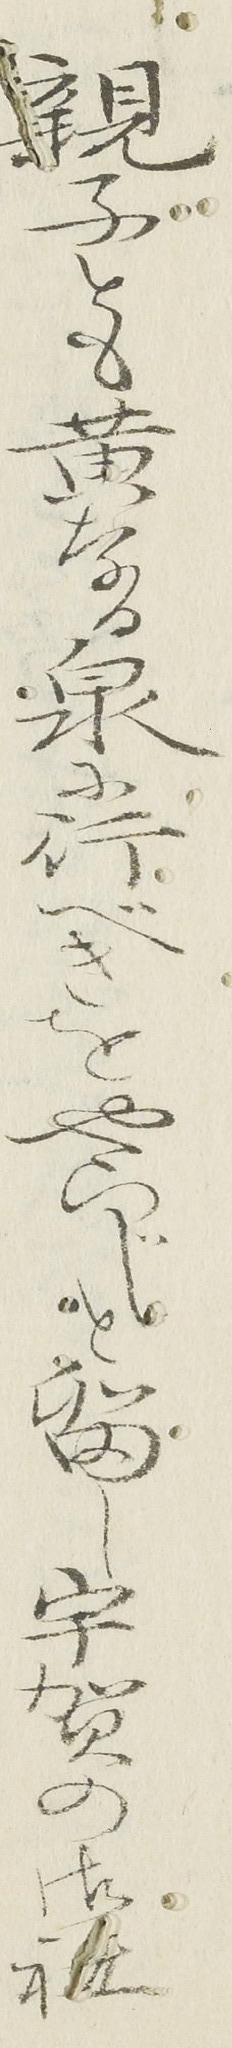親子とも黄なる泉に行べきをやらじと留し宇賀の御社
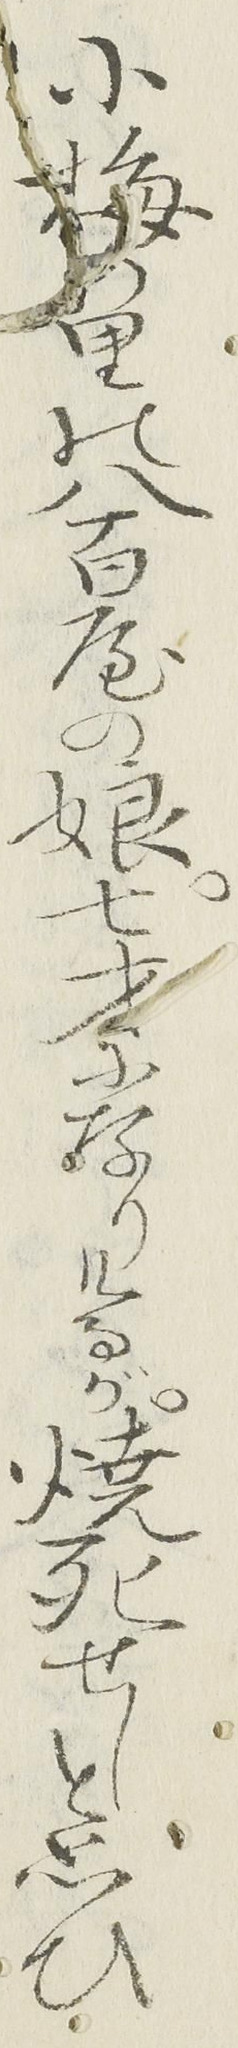小梅の里の八百屋の娘七才になりけるが焼死せしと思ひ
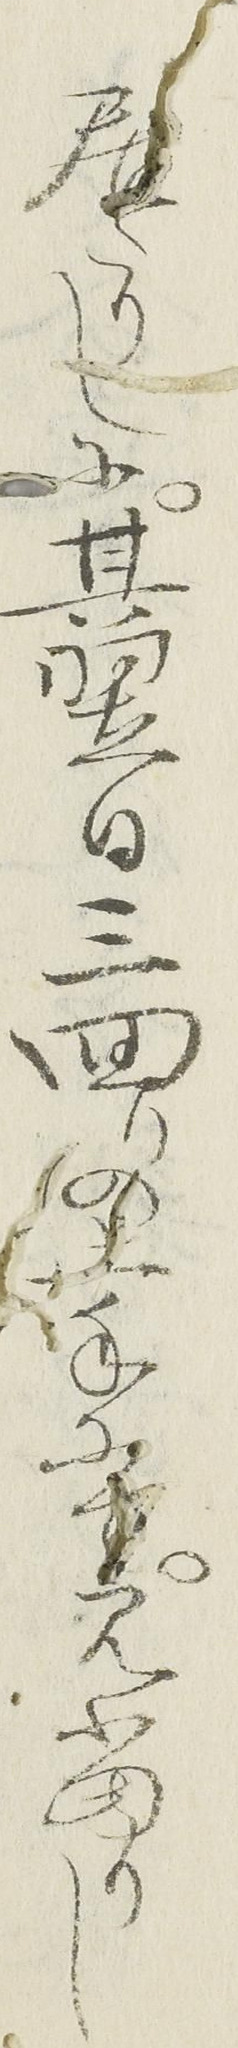居たりしに其翌日三回りの土手に其見当りし

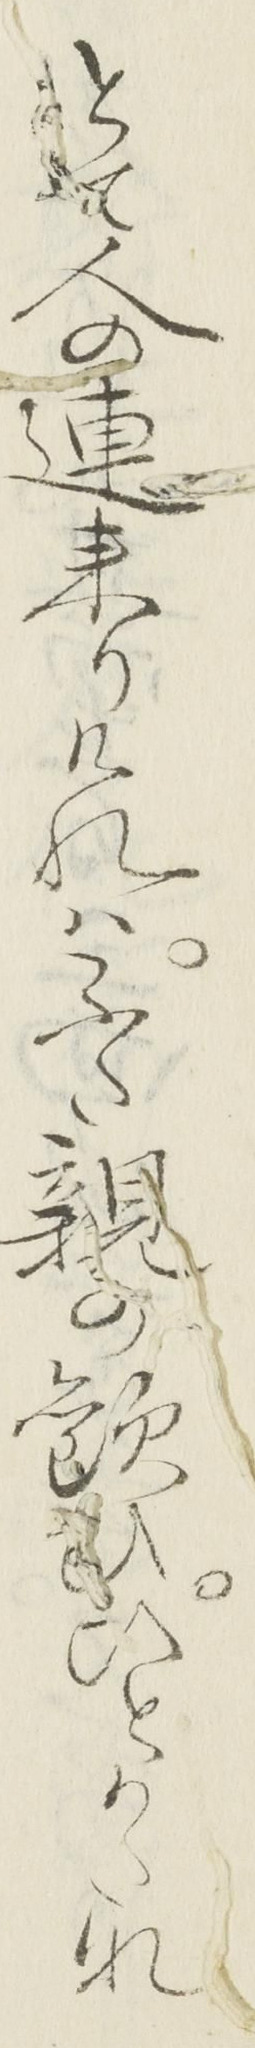とて人の連来りけれハふた親の欲ｔあれひひとり
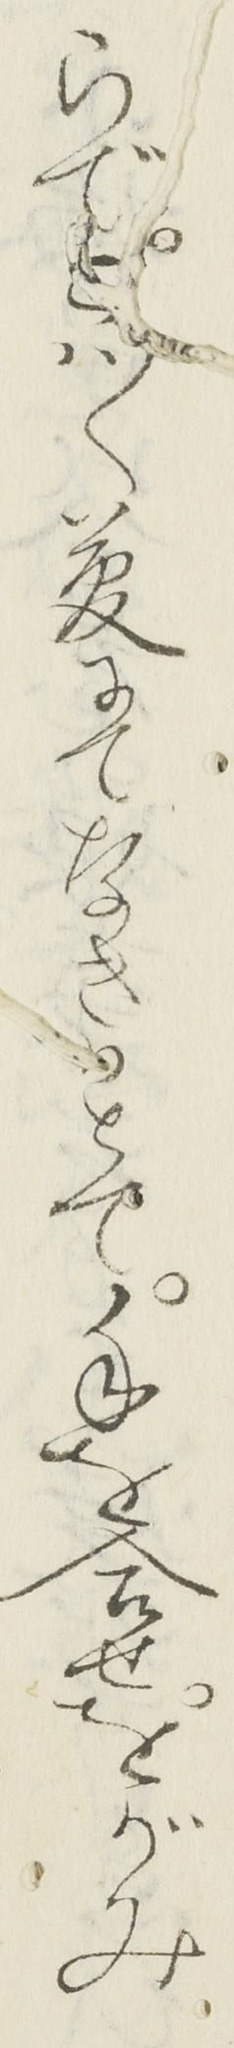らでこハ〳〵処？にてなきかとて手を合せをがみ
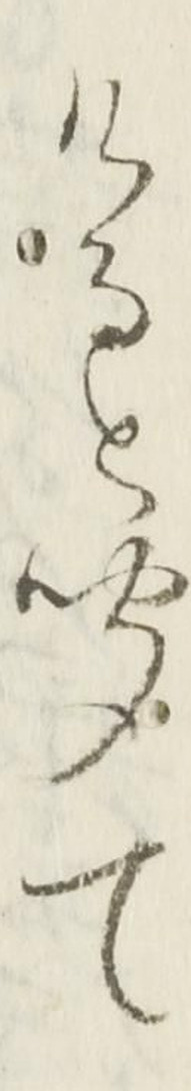けると聞て
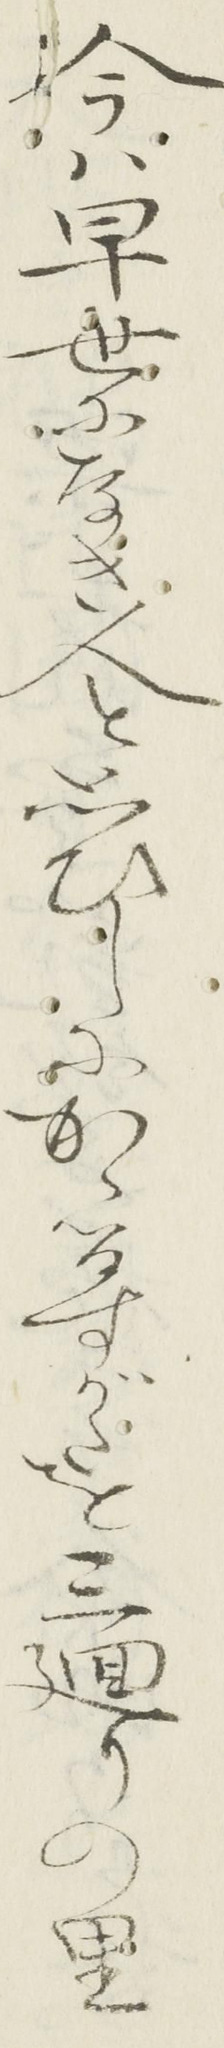早世になき人と思ひしにかゝるすがたを見廻りの里
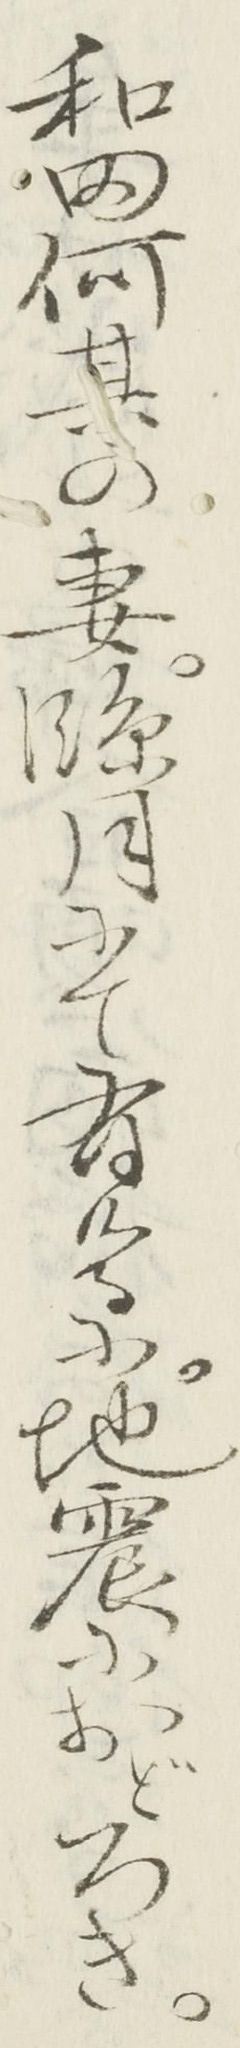和田何某の妻臨月にて有けるに地震におどろき
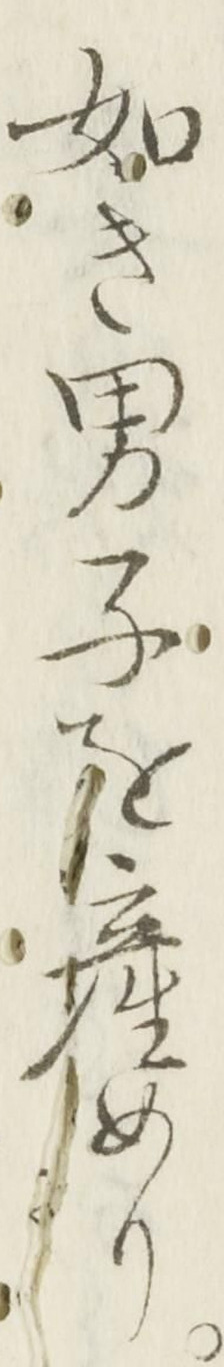如き男子を産めり
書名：地震考證　全
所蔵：東京大学地震研究所図書室 Earthquake Research Institute Library, The University of Tokyo, JAPAN
